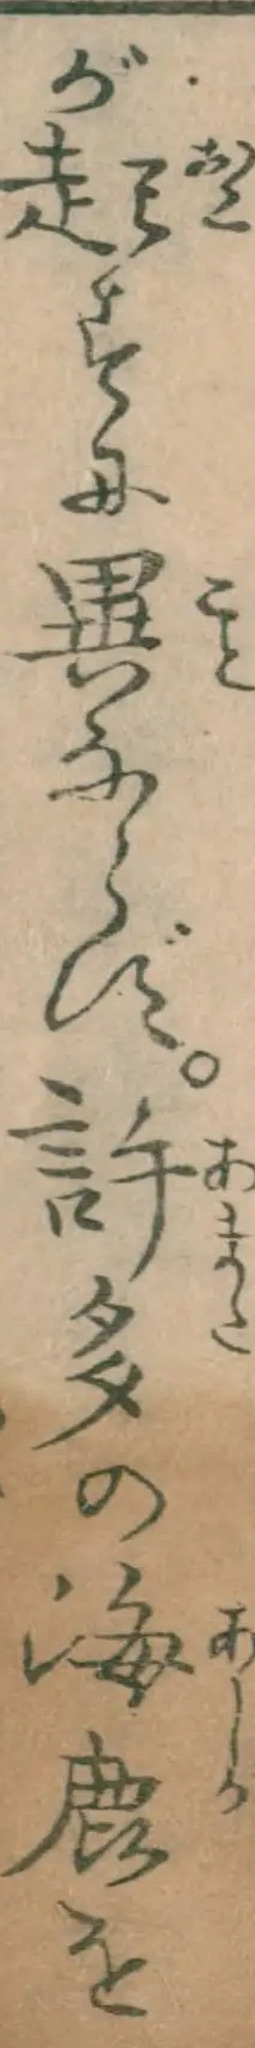が起すに異ならず。許多の海鹿を
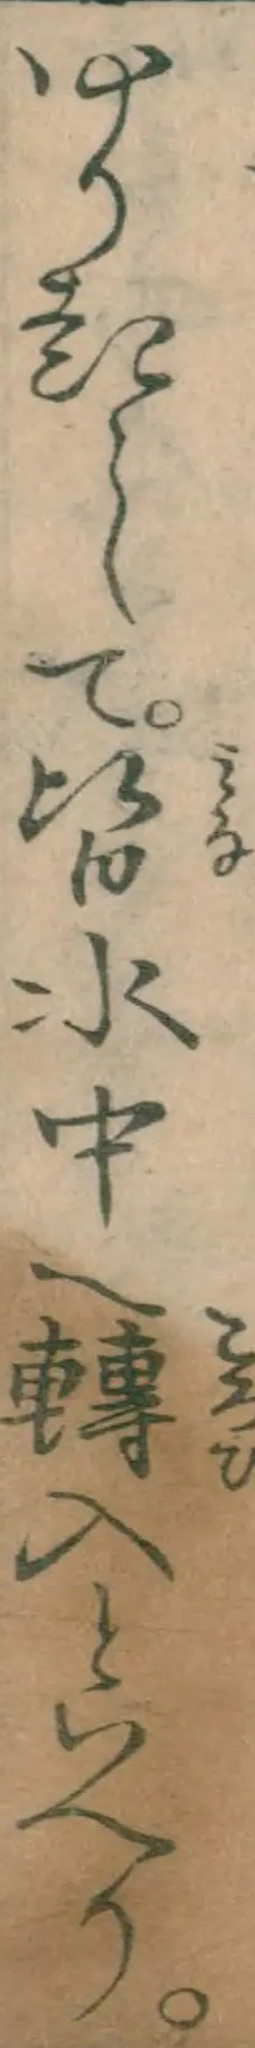ゆり起して。皆水中へ転入といへり。

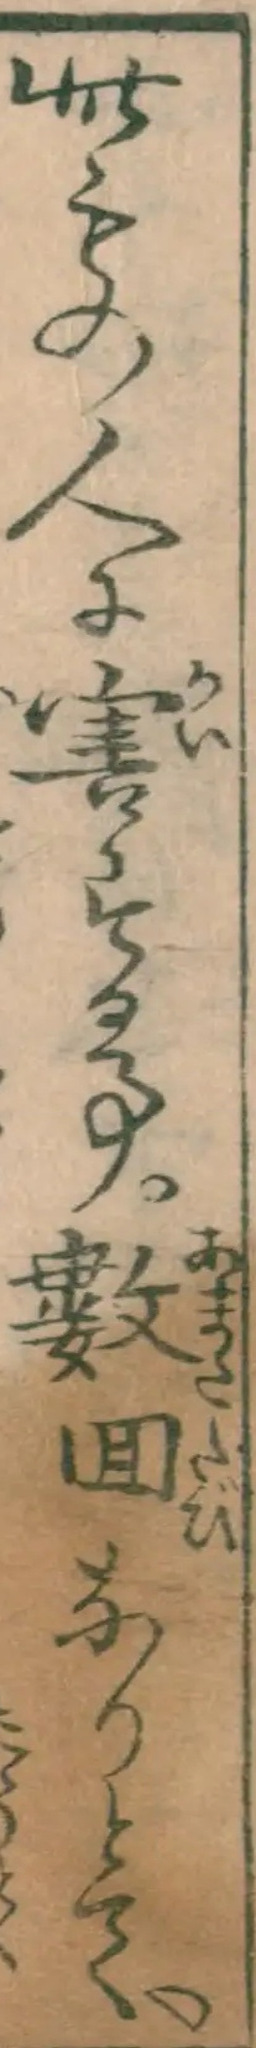此もの人に害する事。数回なりとて。
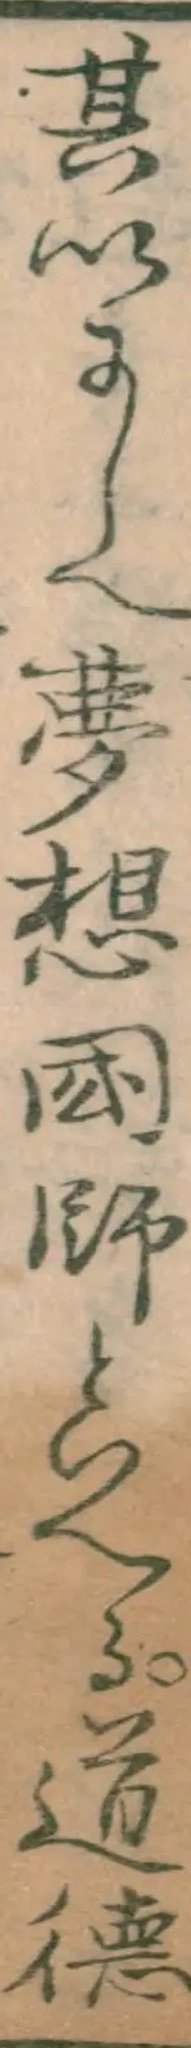其いにしへ夢想国師といへる。道徳
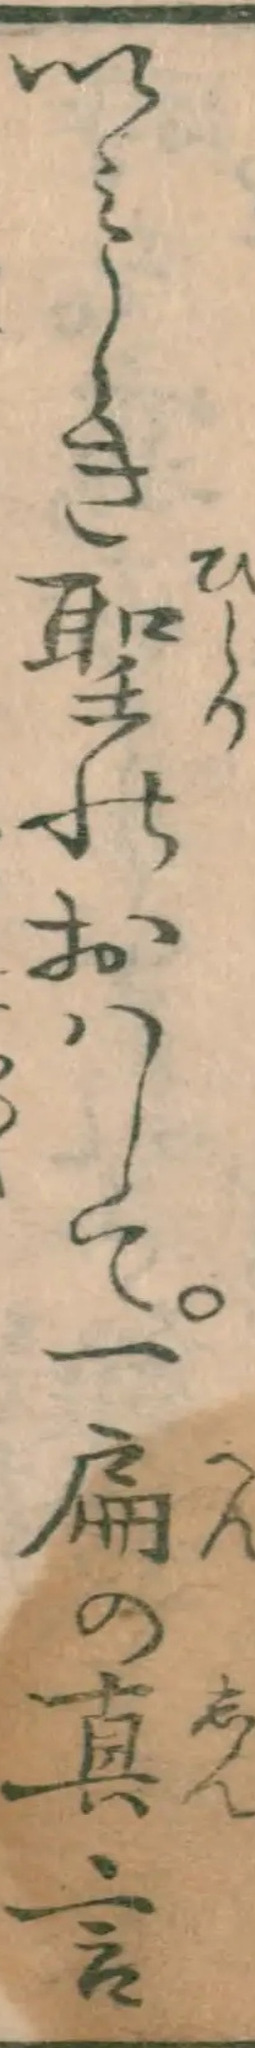いみしき聖のおはして。一扁の真言
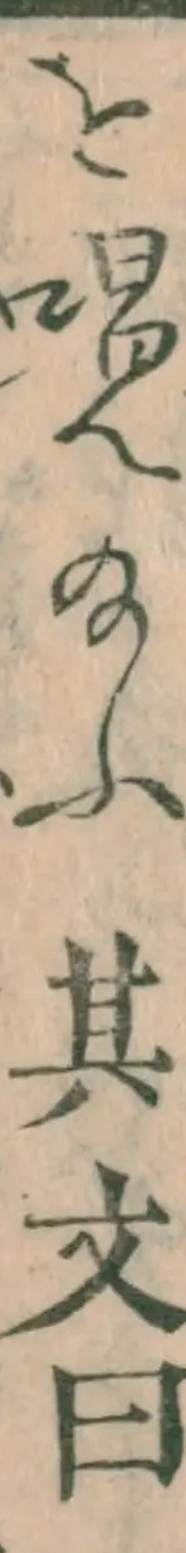を唱へ給ふ。其文曰
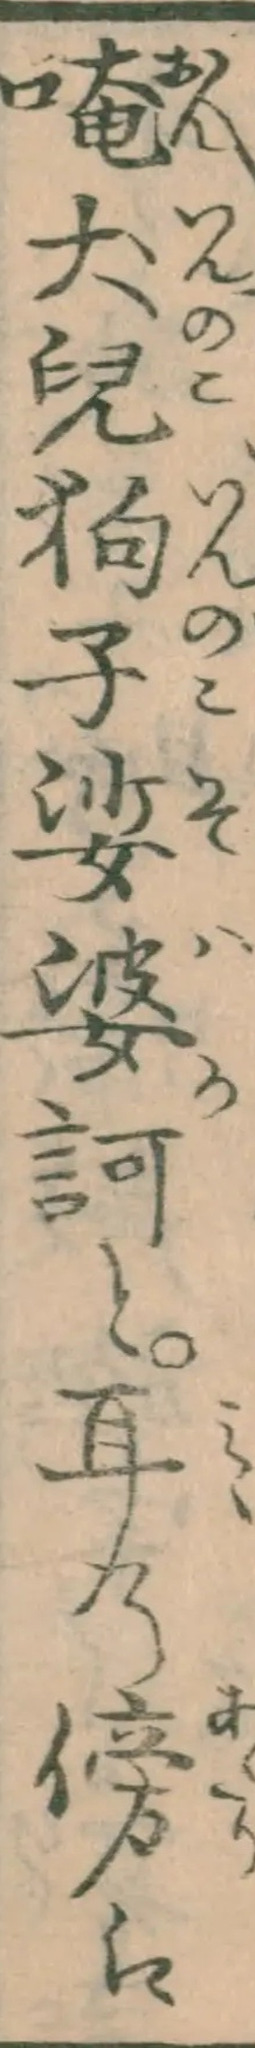唵犬兒狛子娑婆訶と。耳の傍え
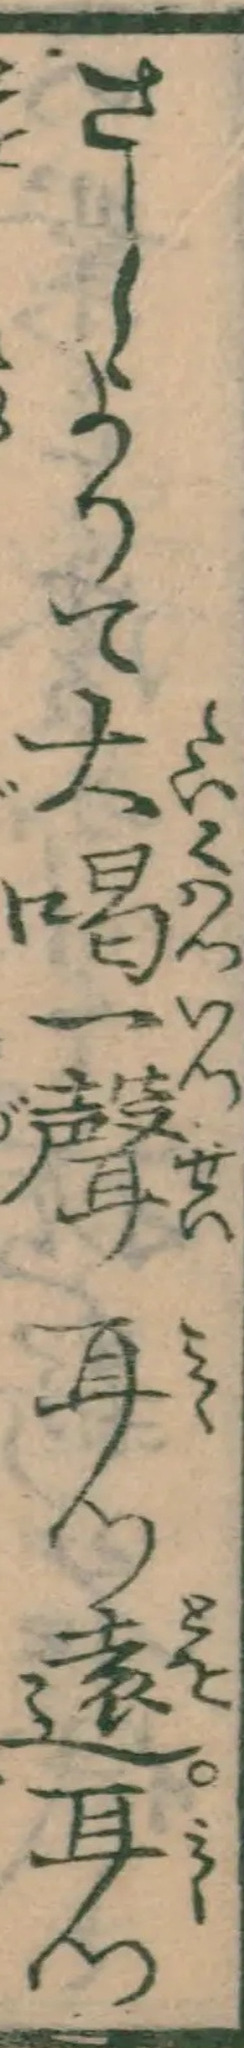さしよりて大喝一声耳つ遠。耳つ
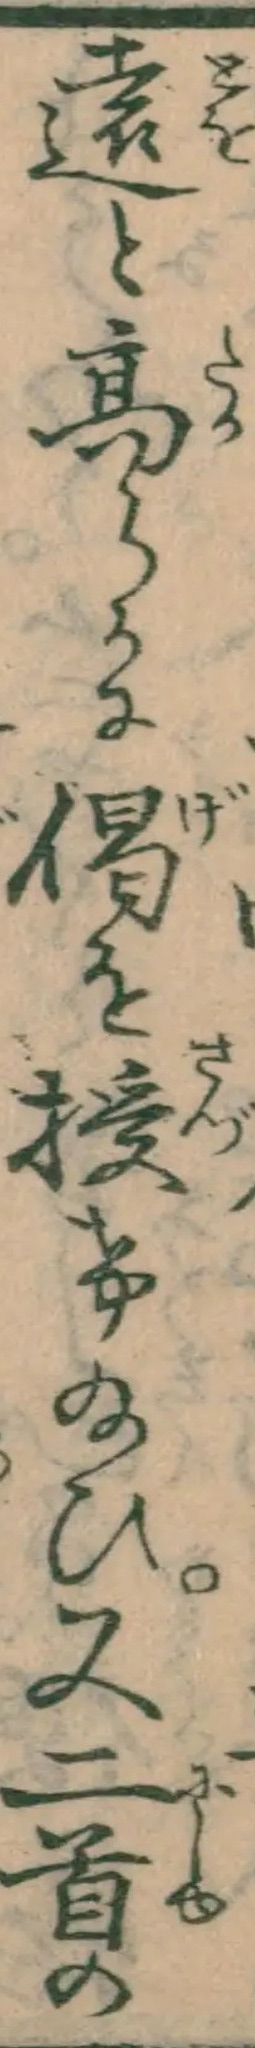遠と高らかに偈を授け給ひ。又二首の
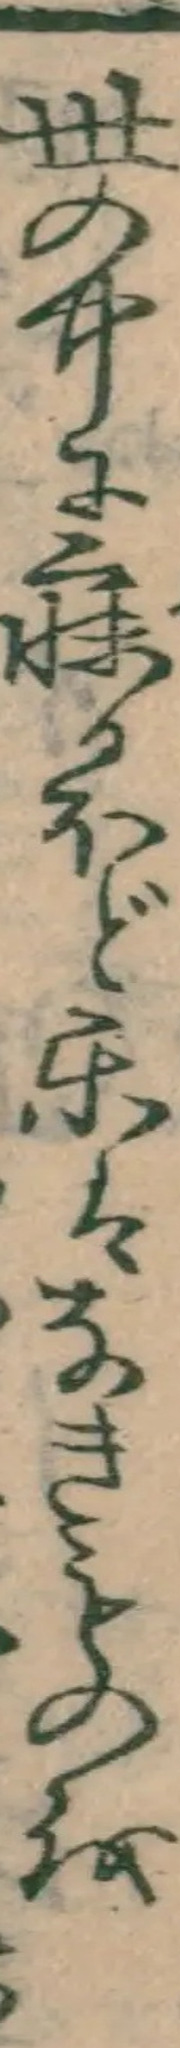世の中に寝るほど楽はなきものを
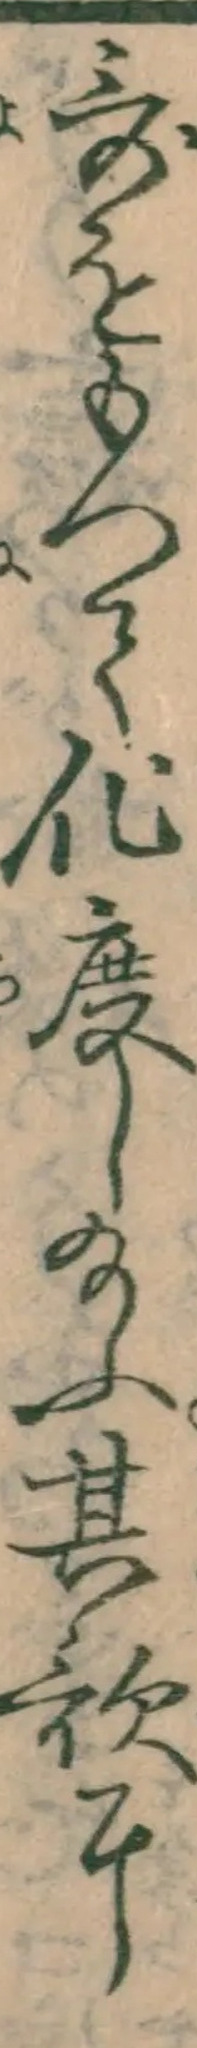歌をもつて化度し給ふ。其歌に
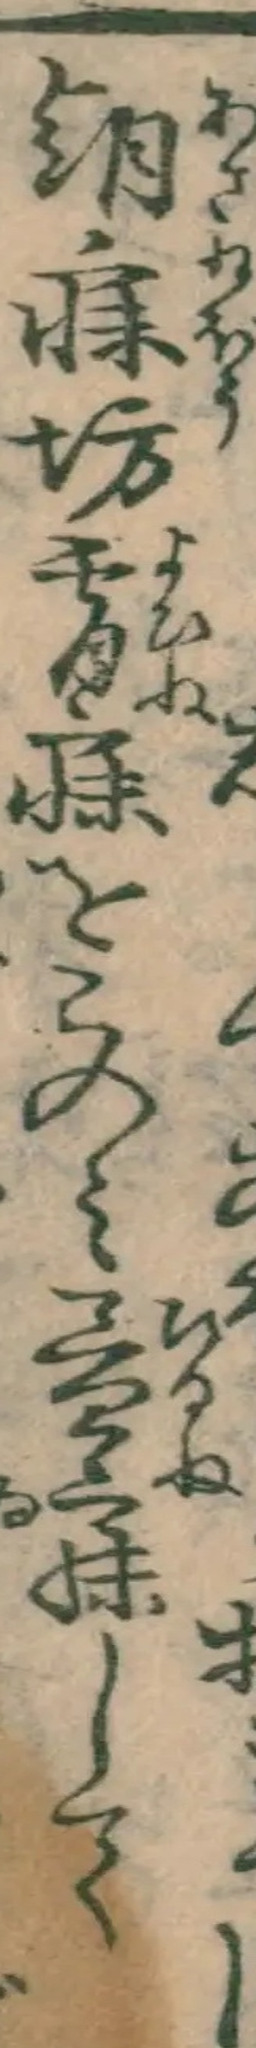朝寝坊宵寝をこのみ昼寝して
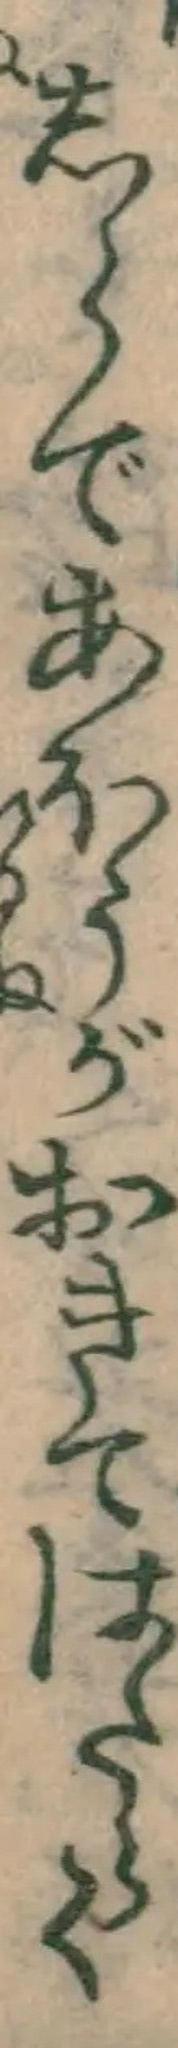しらであほうがおきてはたらく
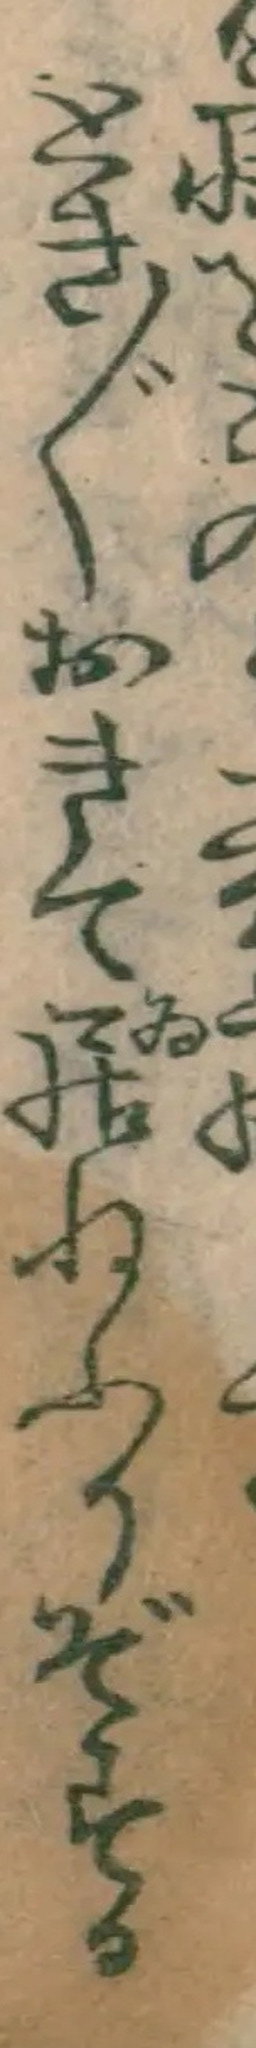とき〴〵おきて居ねふりぞする
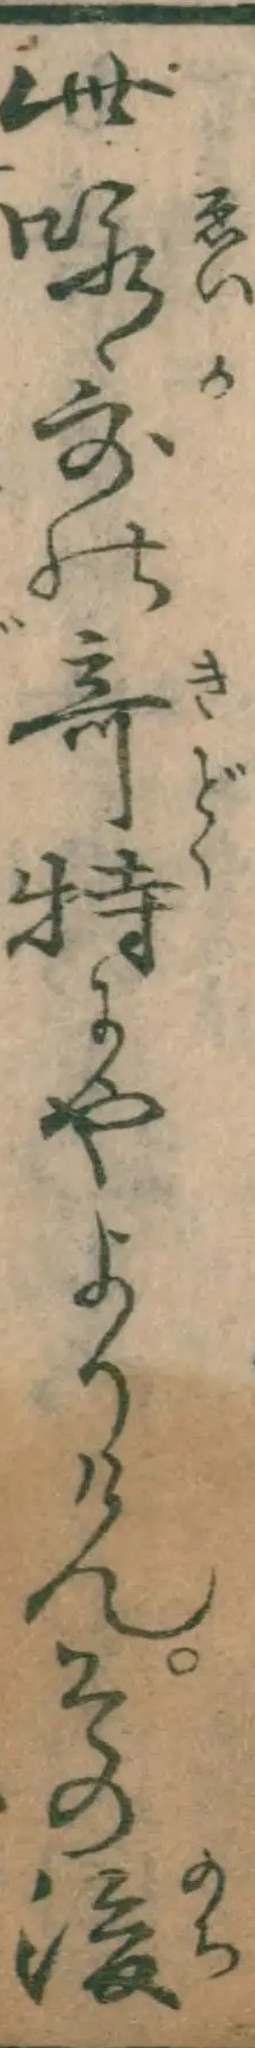此咏歌の奇特にやよりけん。その後
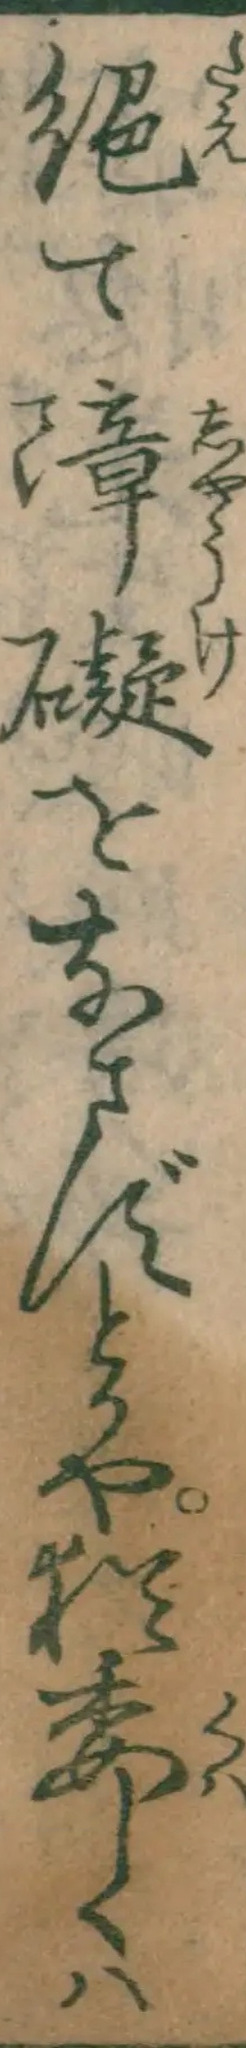絶て障礙をなさずとかや。猶委しくは
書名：麻疹戯言
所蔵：国立国会図書館 National Diet Library, JAPAN
